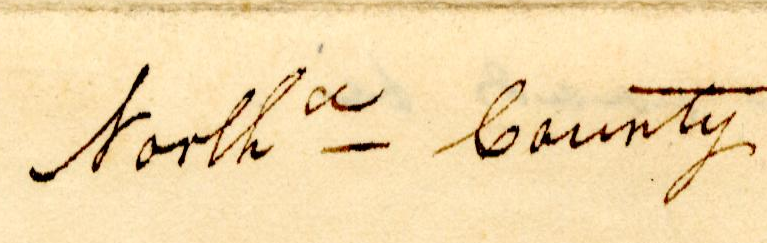North^d County
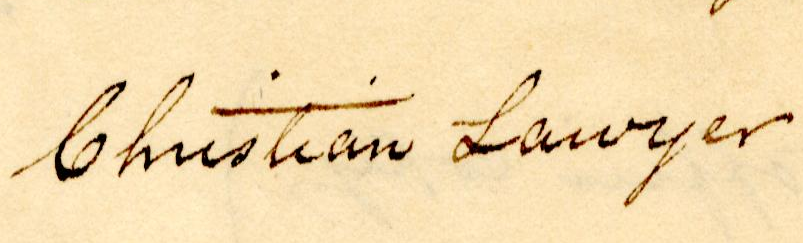Christian Lawyer
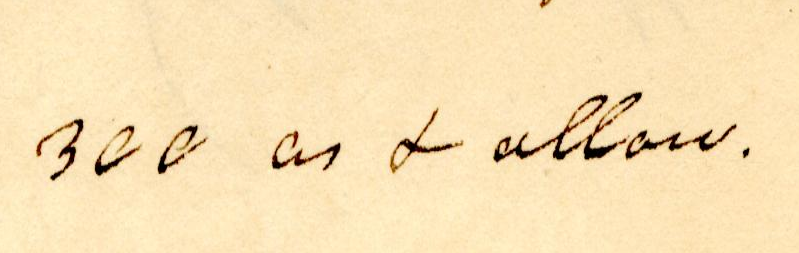300 as & dollars
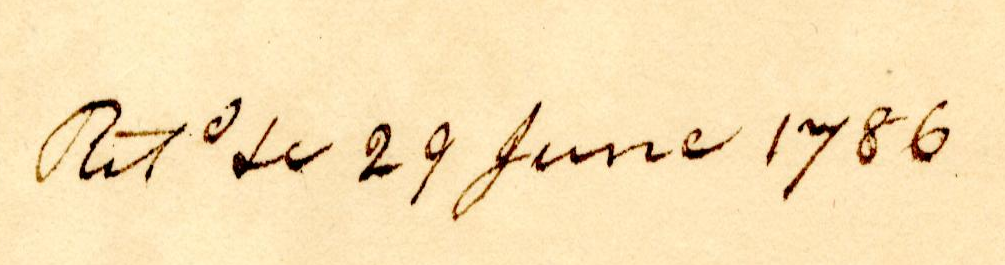Ret^d &c 29 June 1786
